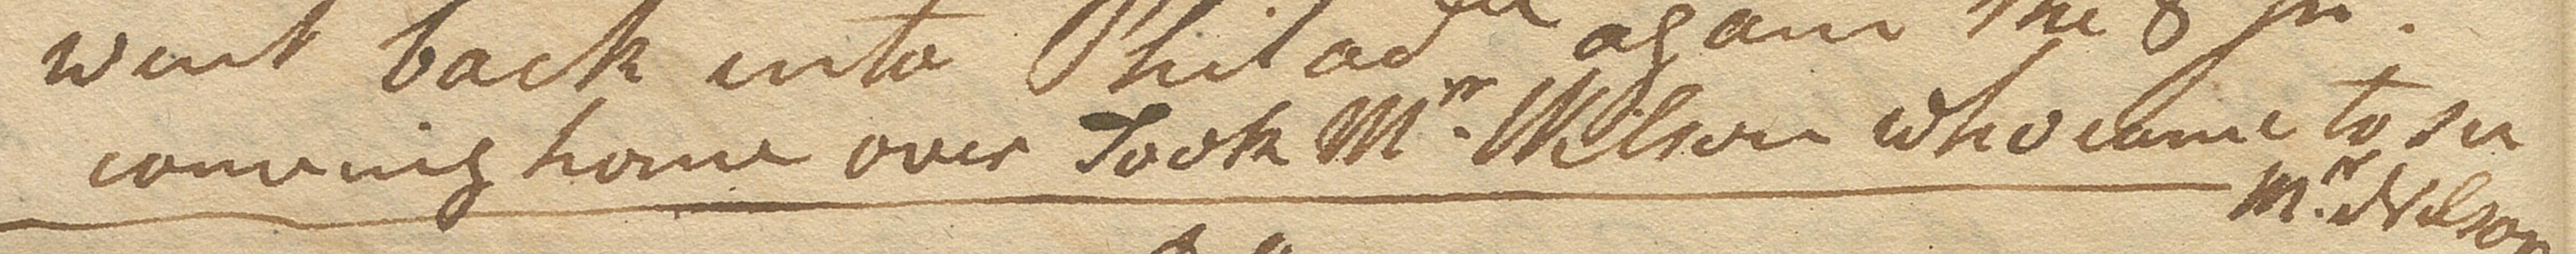comeing home over Took M^r. Wilson who came to see
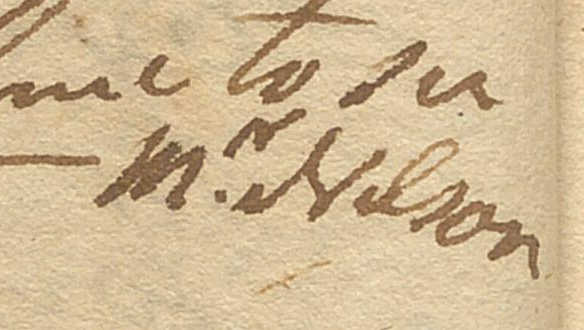M^r. Nelson
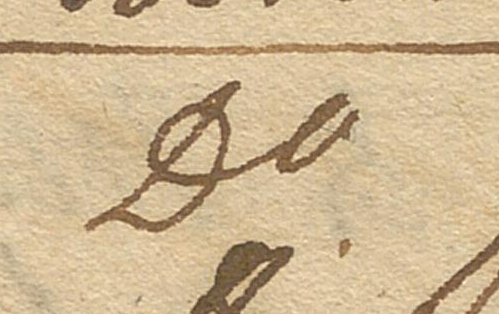D^o.
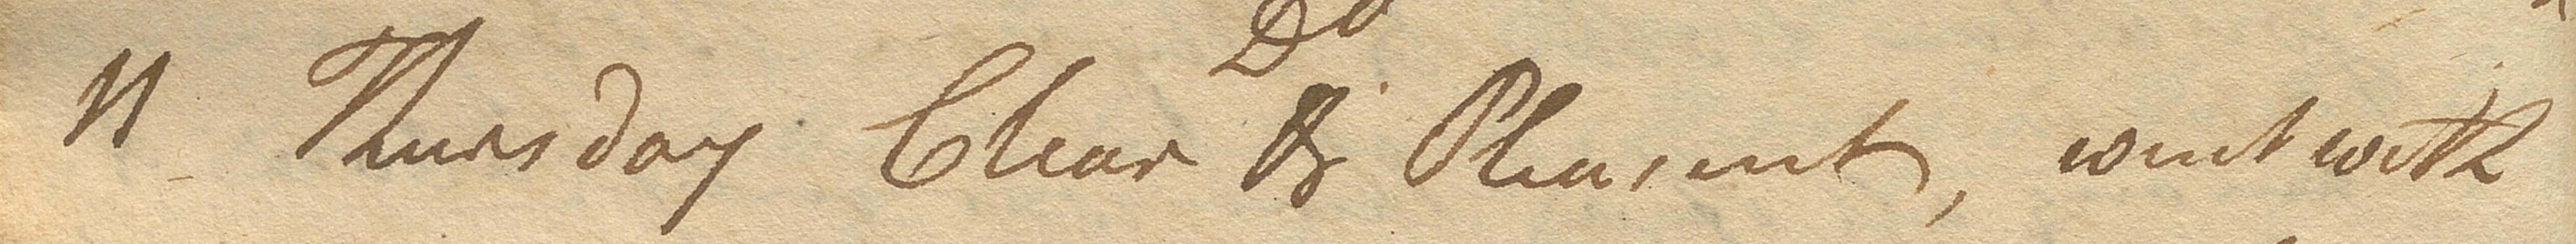11 Thursday Clear & Pleasent went with
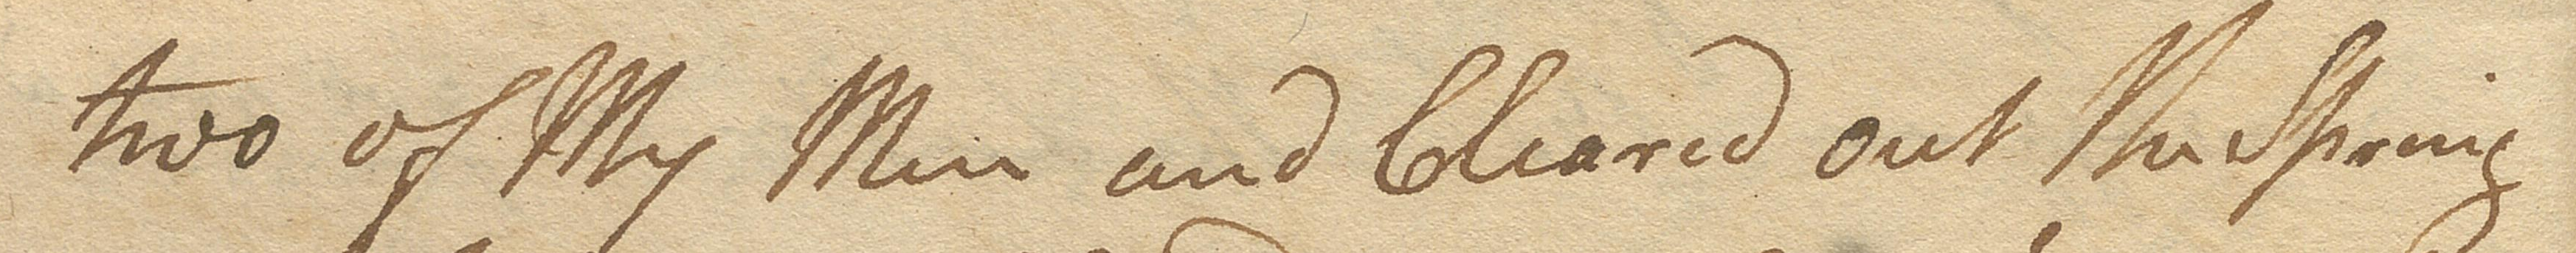two of My Men and Cleared out the Spring
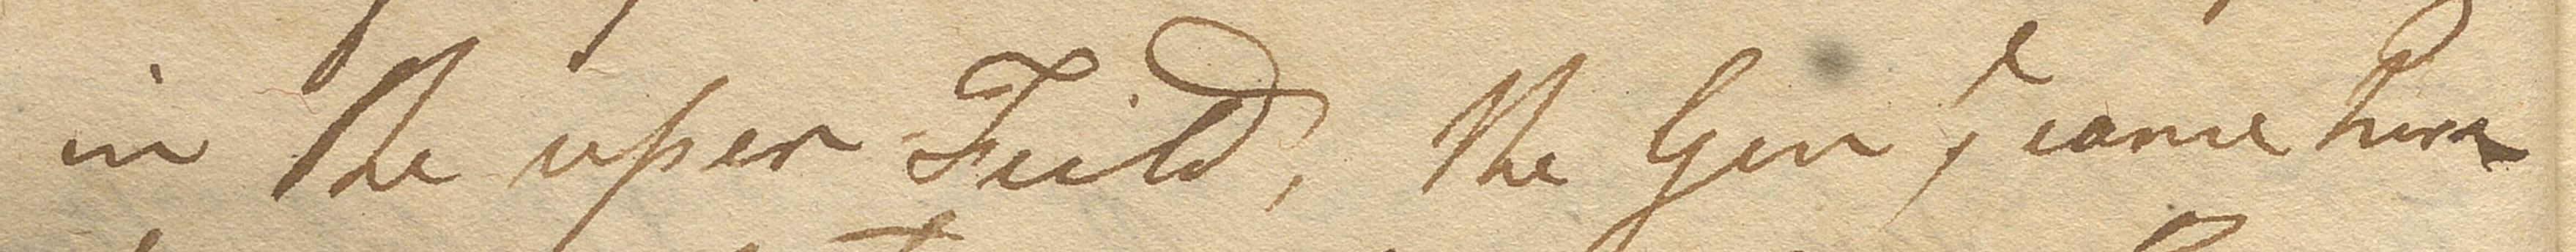in the uper Field, the Gen^l came here
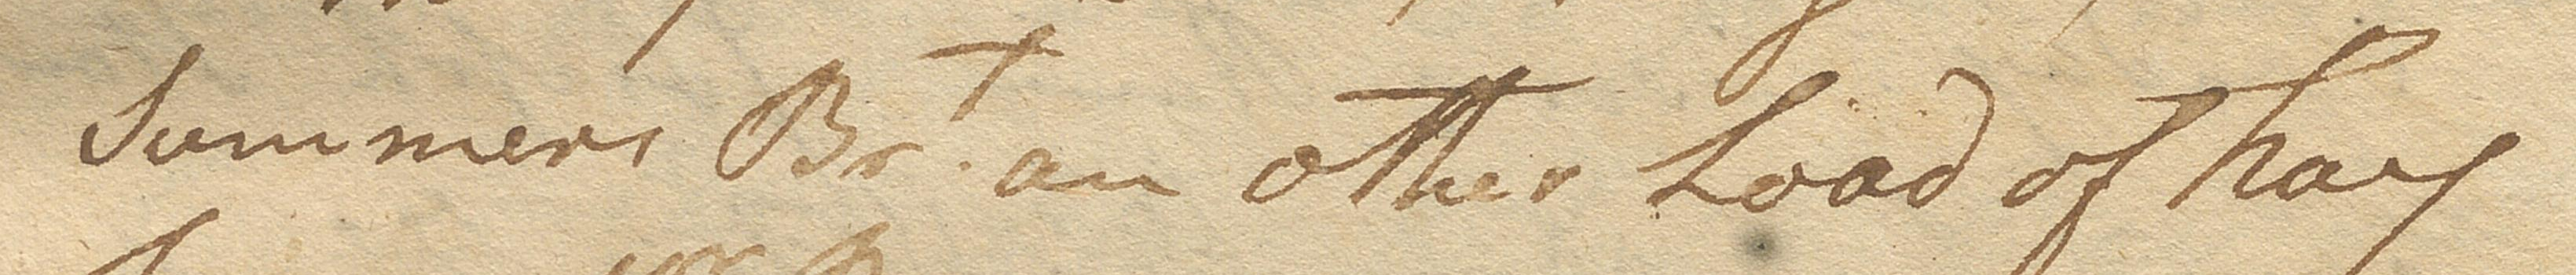Summers Br^t. an other Load of hay
